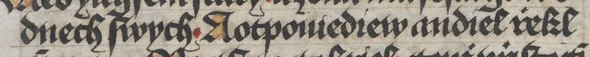dnech ſwych.A otpouiediew andiel ṙekl
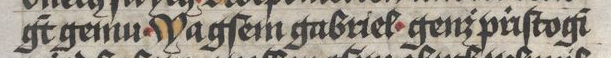ḡt gemu.Ya gſem gabriel.genż pṙiſtogī
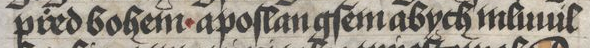pṙed bohení.a poſlan gſem abych mluuil
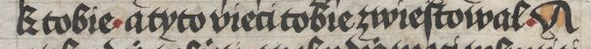ktobie.a tyto vieci tobie zwieſtowal.A
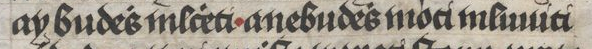ay budeṡ mlċeti.anebudeṡ moci mluuiti
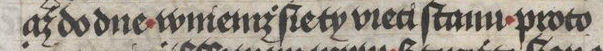až do dne.wniemż ſie ty vieci ſtanu.proto
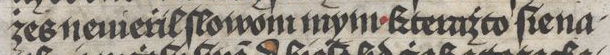żes neuieṙil ſlowom mym.kteraż to ſie na-
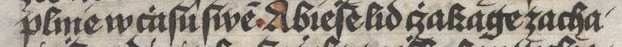plnie w ċaſu ſwē.A bíeẛe lid cżakage zacha¬
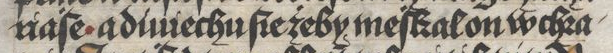riaẛe.a diuiechu ſie żeby meẛkal on wchra¬
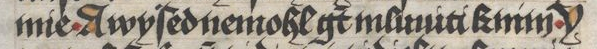mie.A wyẛed nemohl ḡt mluuiti knim.Y
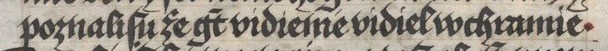poznaliſu że ḡt vidieníe vidiel wchrame.
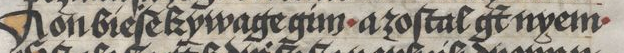A on bíeẛe kywage gim.a zoſtal ḡt nyem.
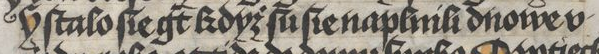Yſtalo ſie ḡt když ſu ſie naplnili dnowe v¬
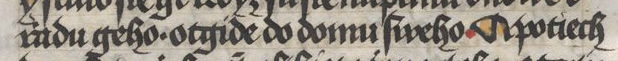radu geho.otgíde do domu ſweho.A potiech
